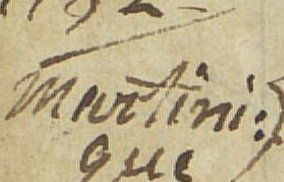martini:
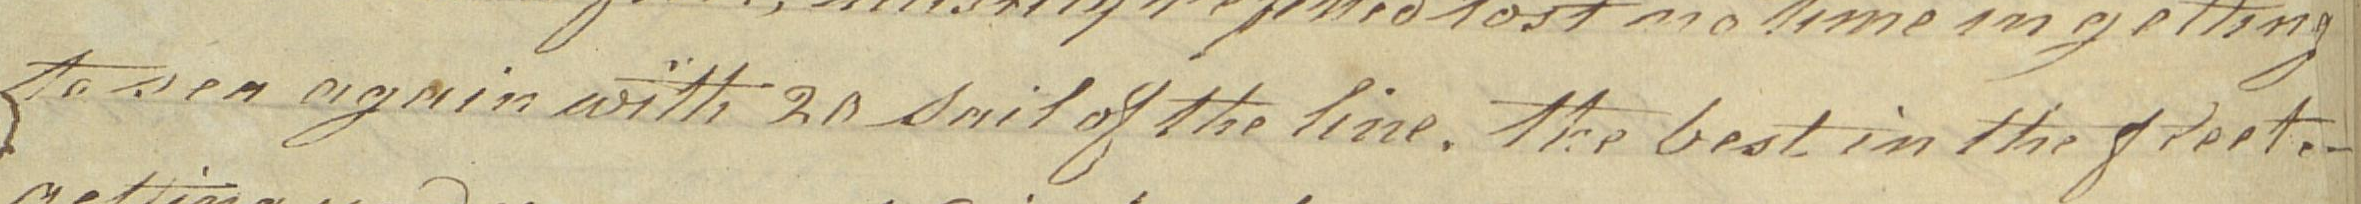to sea again with 20 sail of the line. the best in the fleet.
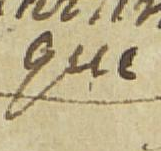que
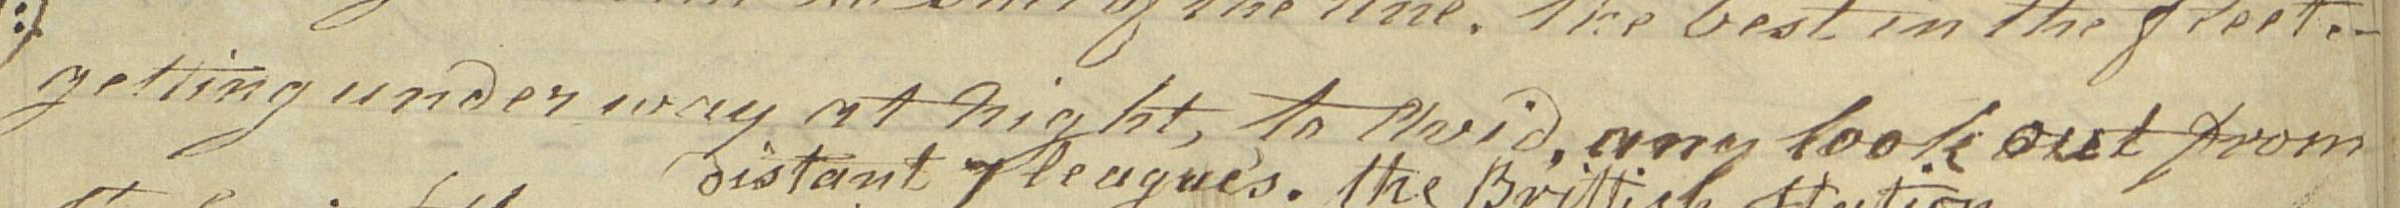getting under way at night, to avid, any look out from
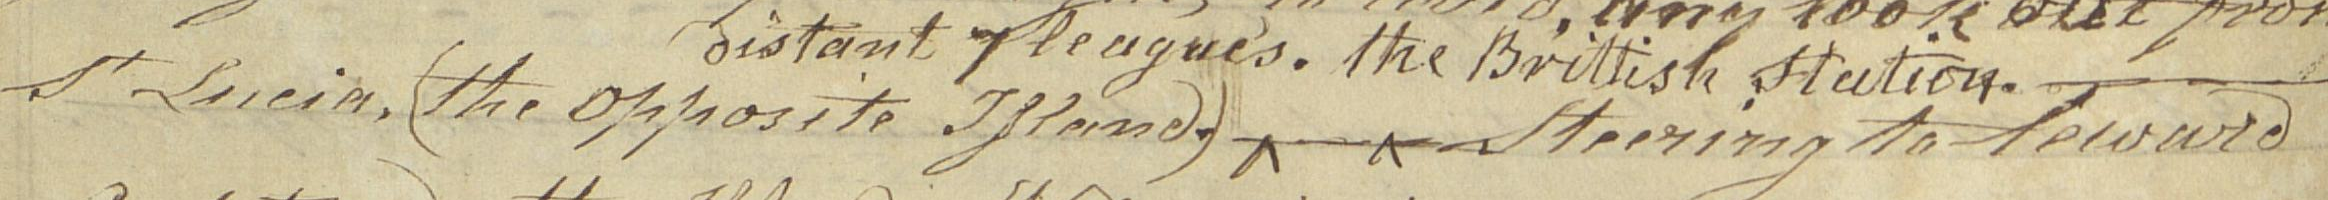S^t Lucia (the opposite Island.) ^ ^ steering to leward
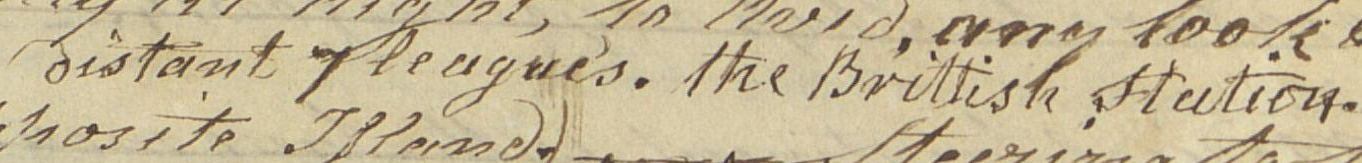distant 7 leagues. the Brittish Station
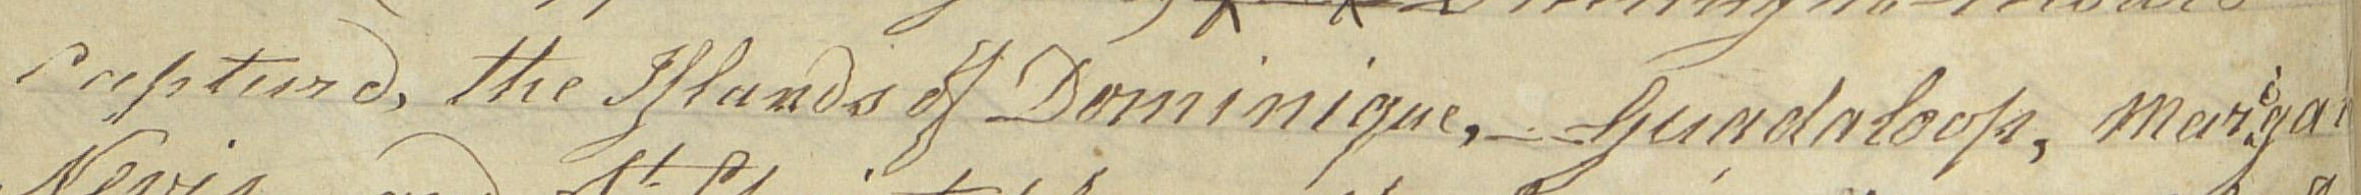Capturd, the Islands of Dominique, Guadaloop, Maroga
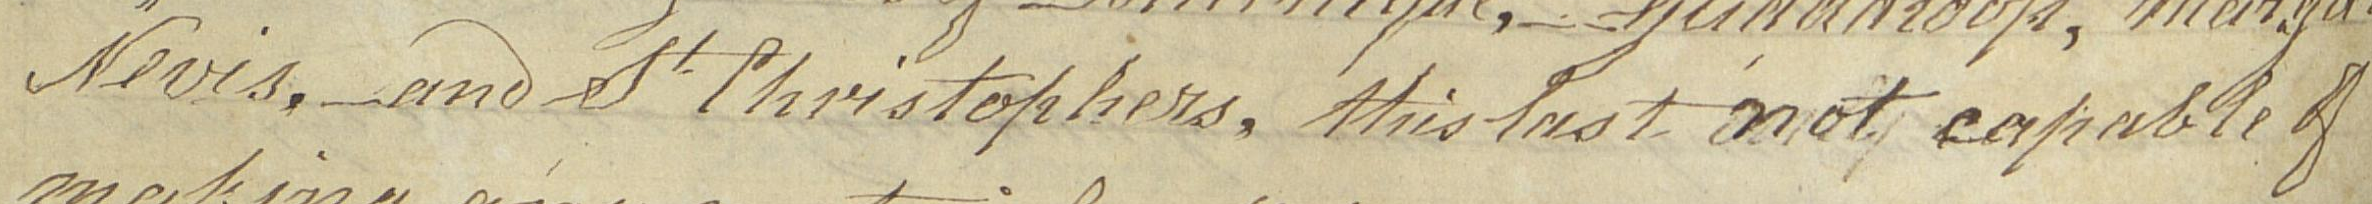Nevis, and S^t Christophers, this last not capable of
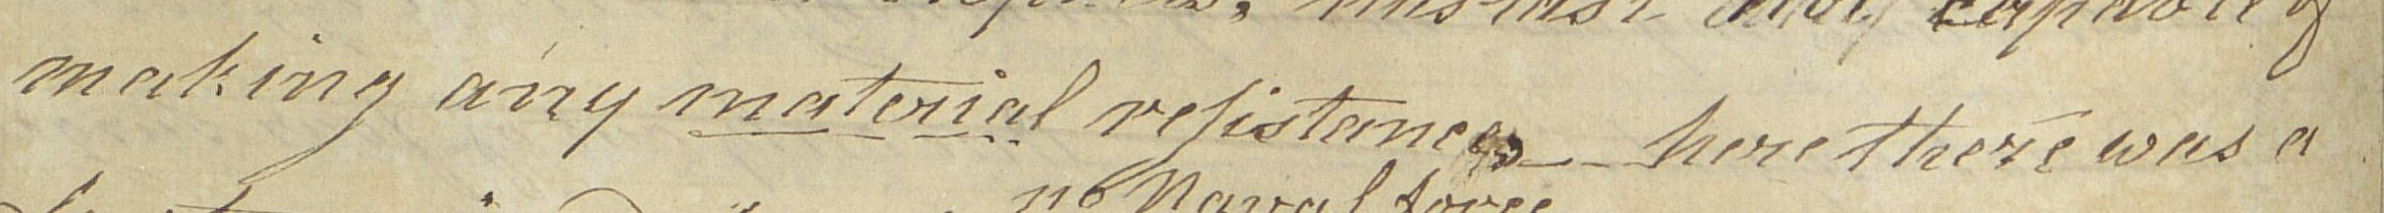making any material resistance, here there was a
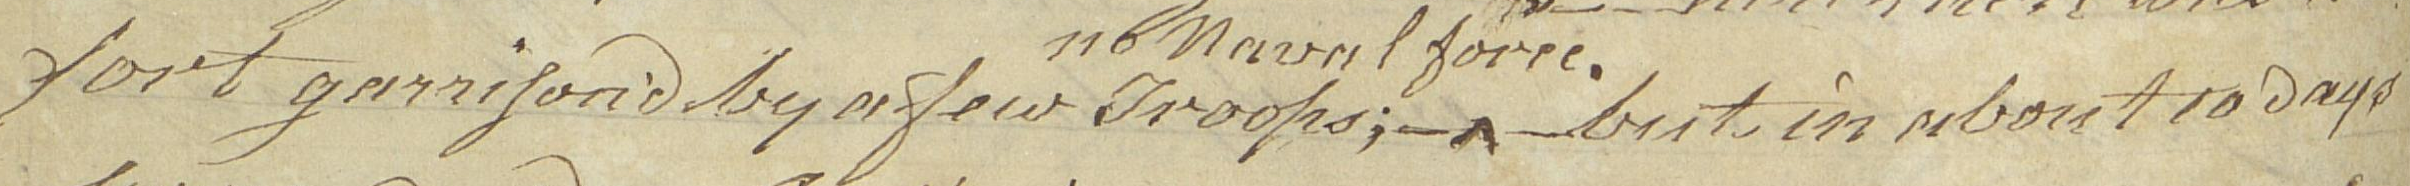fort garrison'd by a few Troops; ^ but in about 10 days
